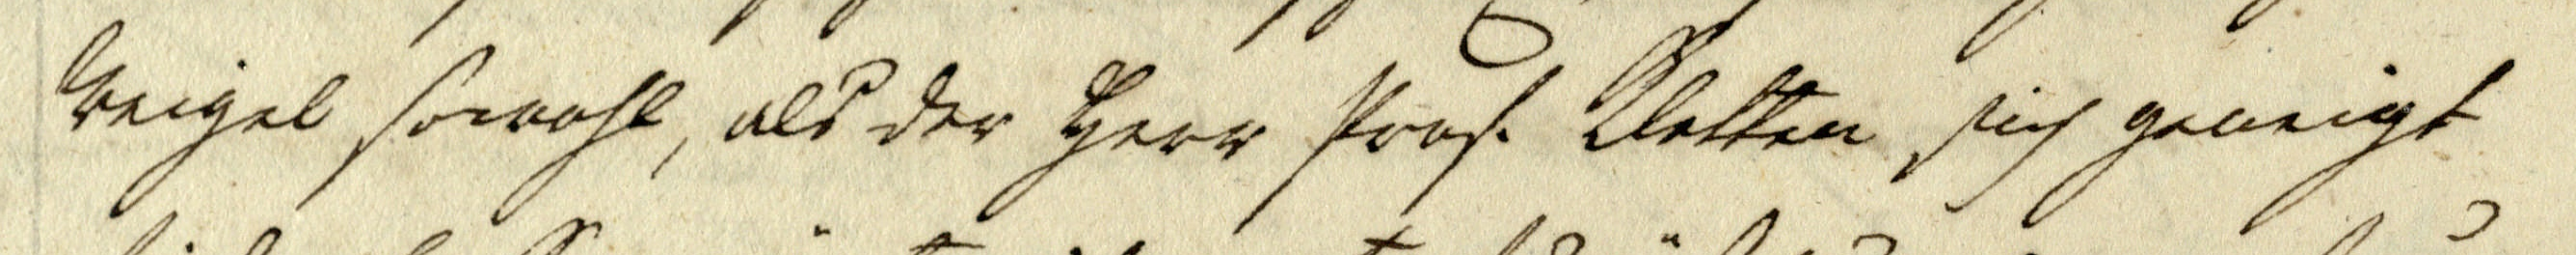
Weigel sowohl, als der Herr Prof. Kletten sich geneigt
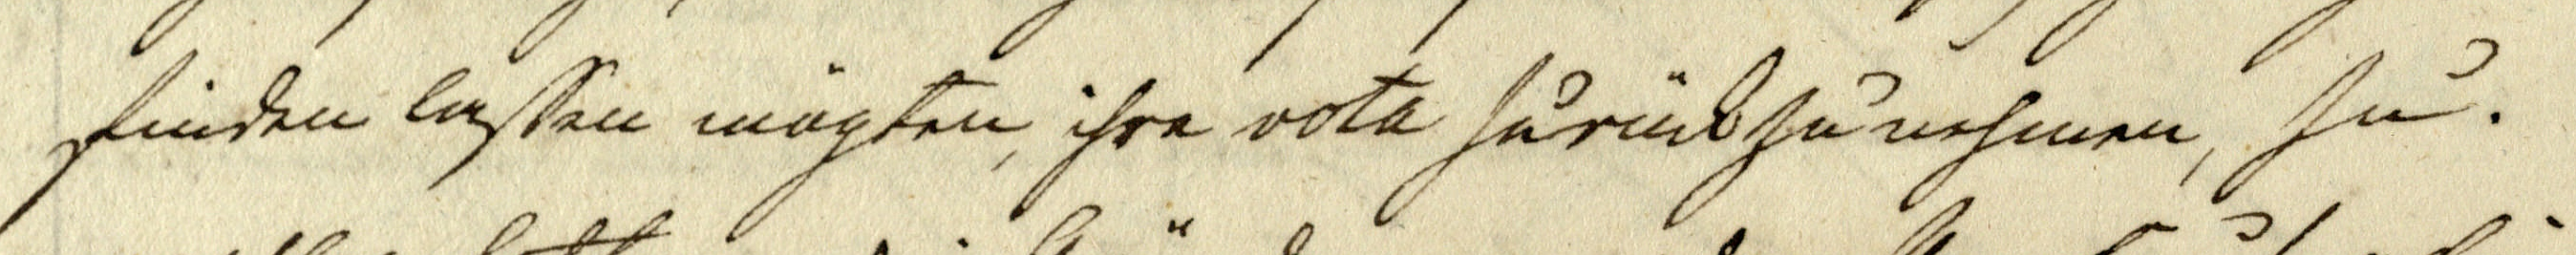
finden lassen mögten, ihre vota zurückzunehmen, zu¬
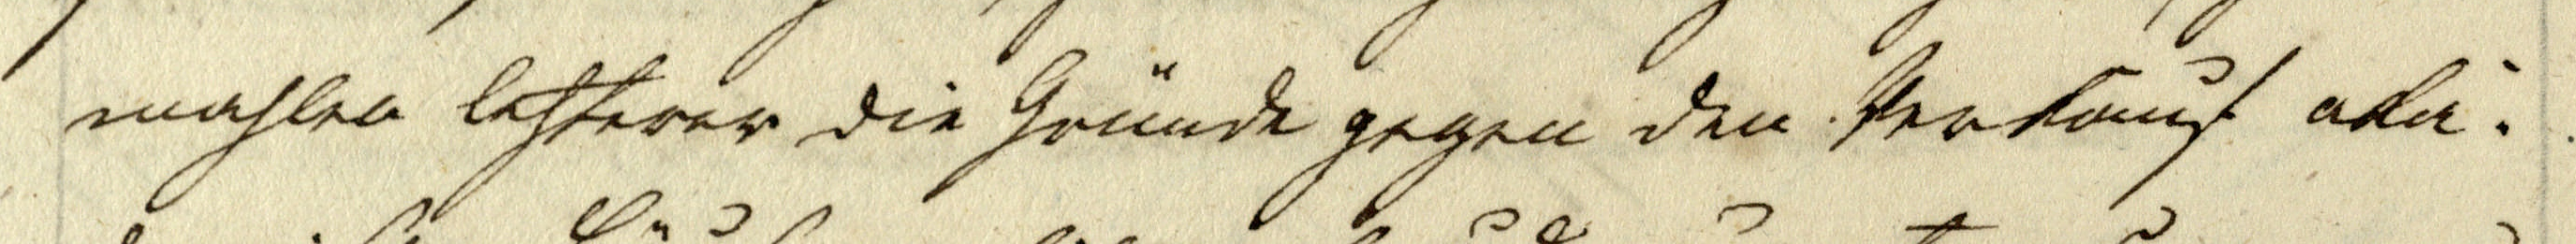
mahlen letzterer die Gründe gegen den Verkauf aka¬
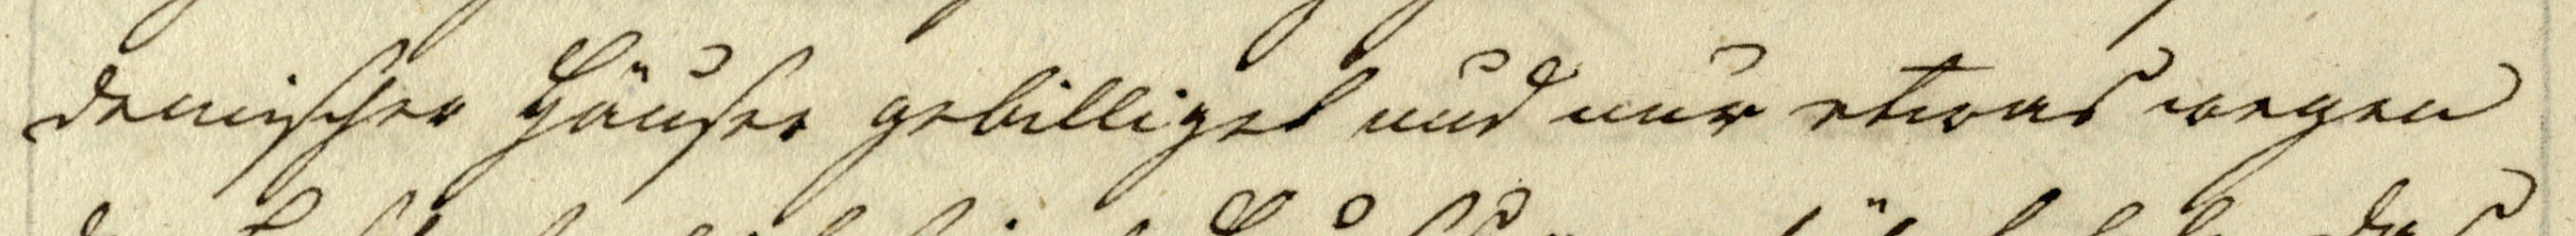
demischer Häuser gebilliget und nur etwas wegen
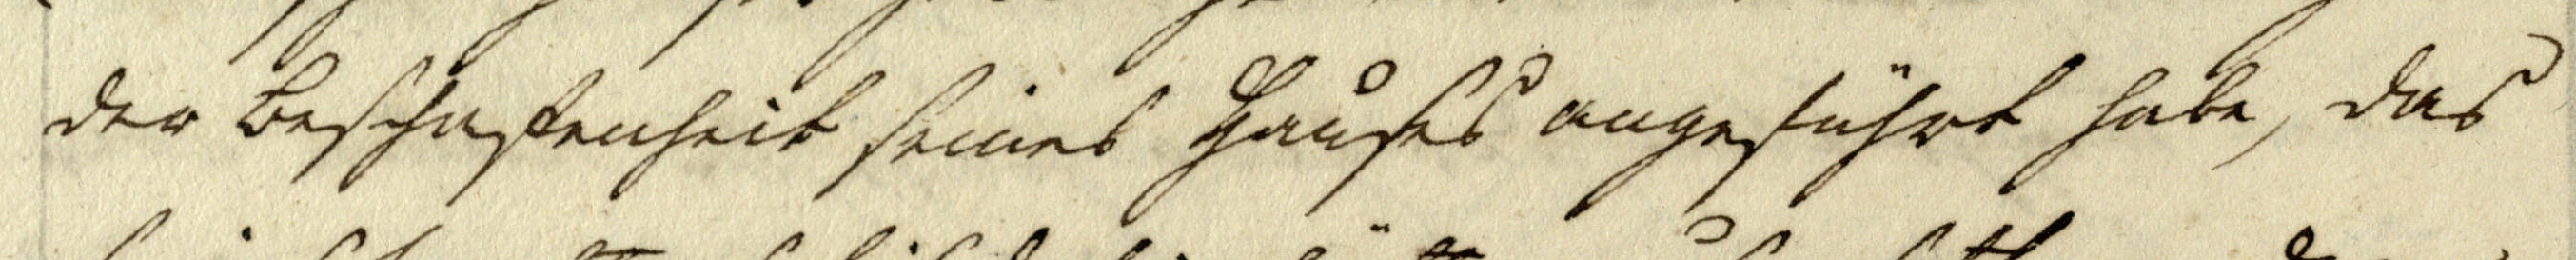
der Beschafenheit seines Hauses angeführt habe, das
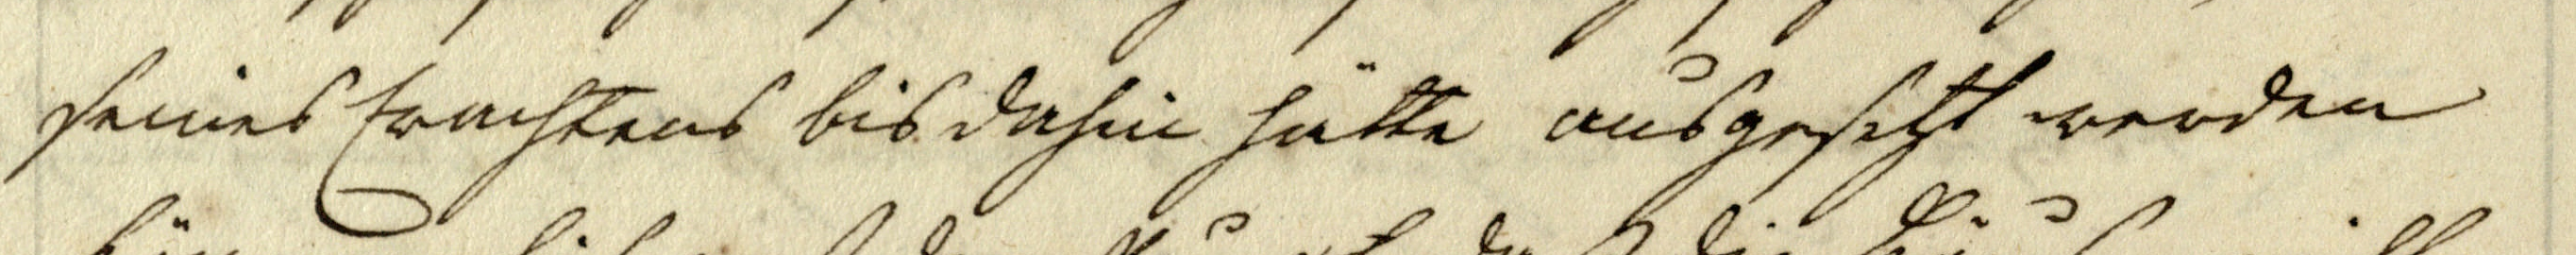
seines Erachtens bis dahin hätte ausgesetzt werden
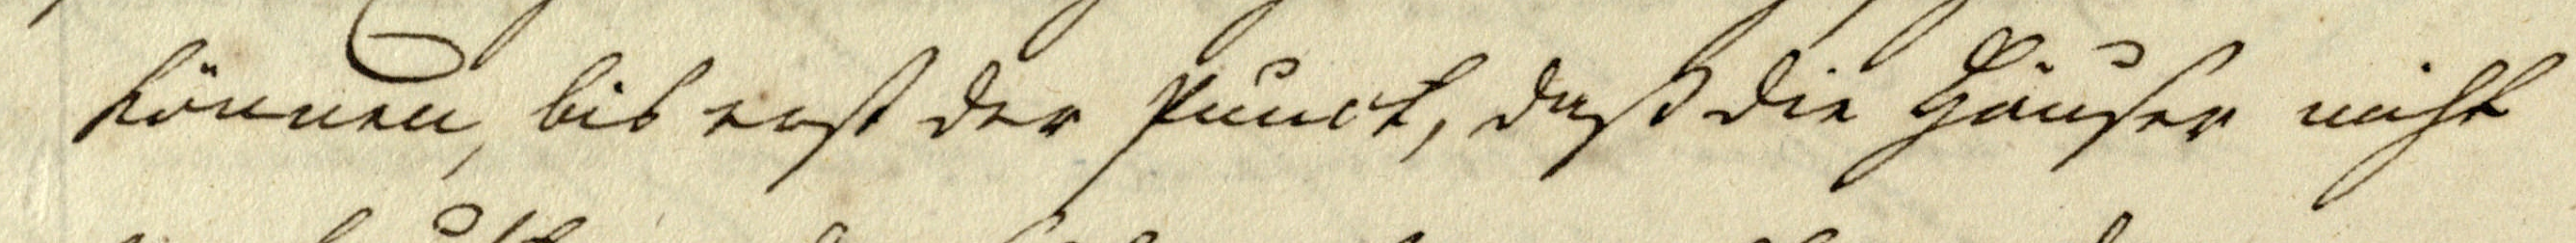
können, bis erst der Punct, daß die Häuser nicht
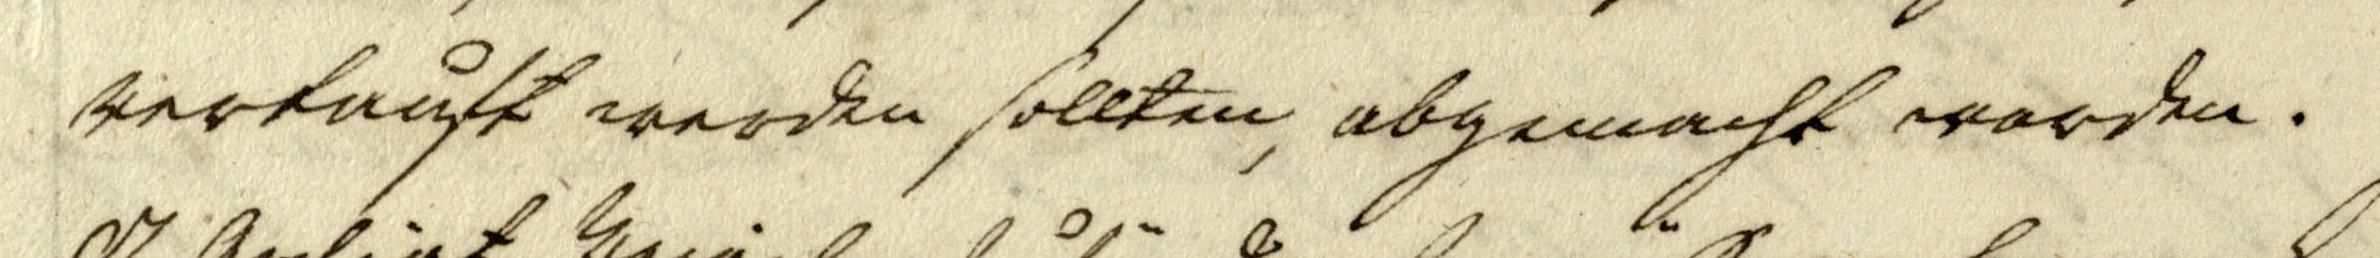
verkauft werden sollten, abgemacht worden.
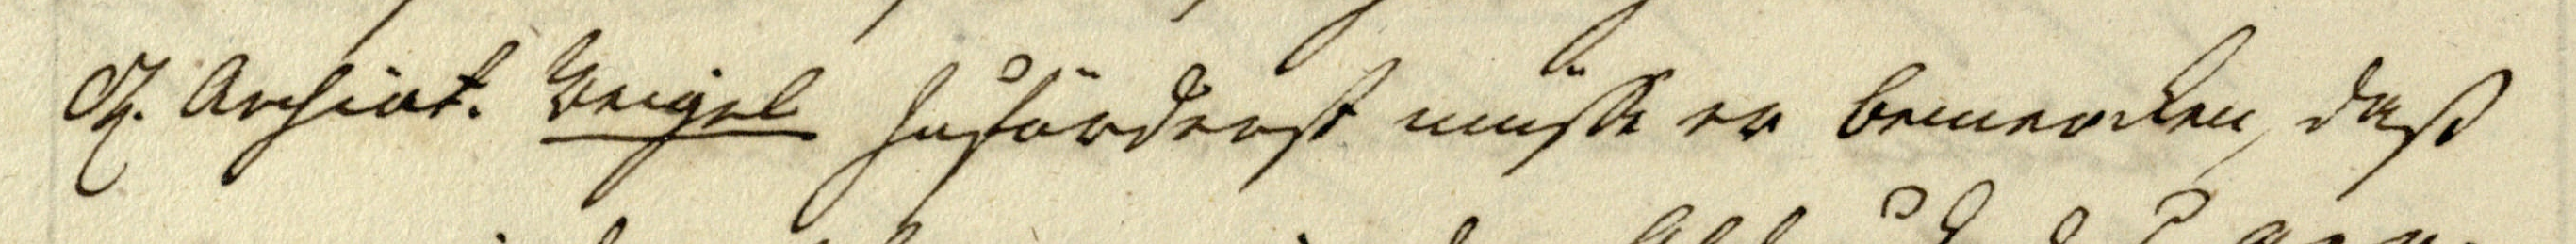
dh. Archiat. Weigel zuförderst müsse er bemercken, daß
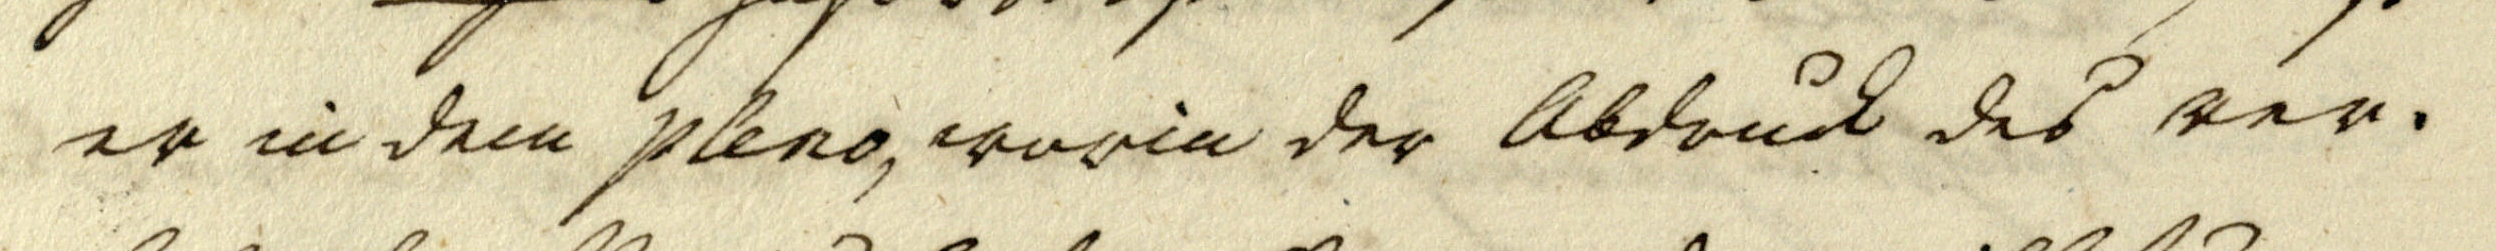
er in dem pleno, worin der Abdruck des ver¬
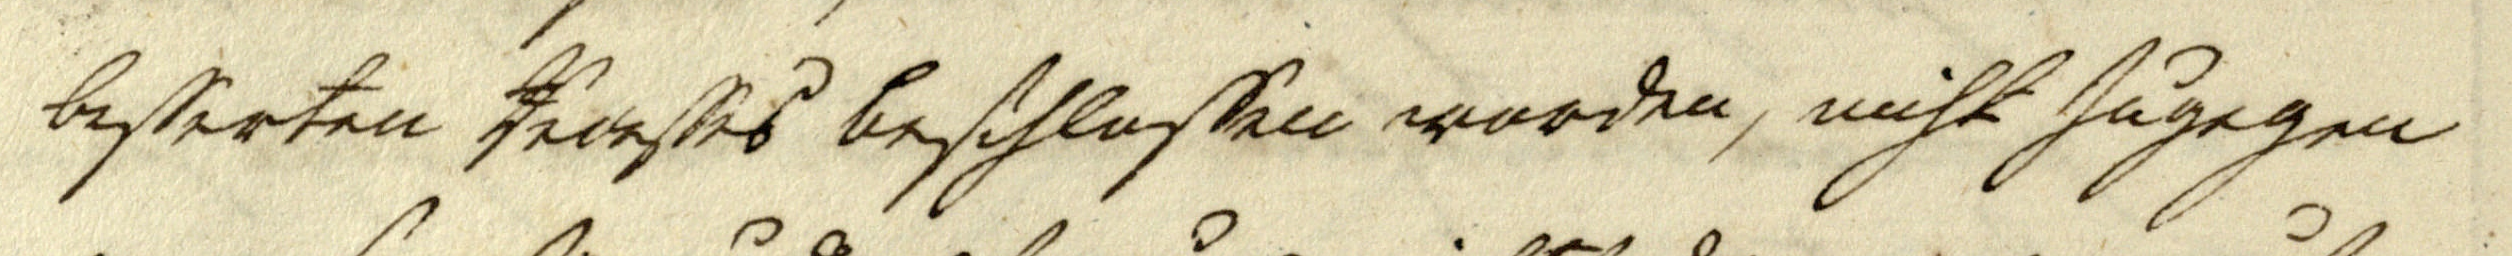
besserten Recesses beschlossen worden, nicht zugegen
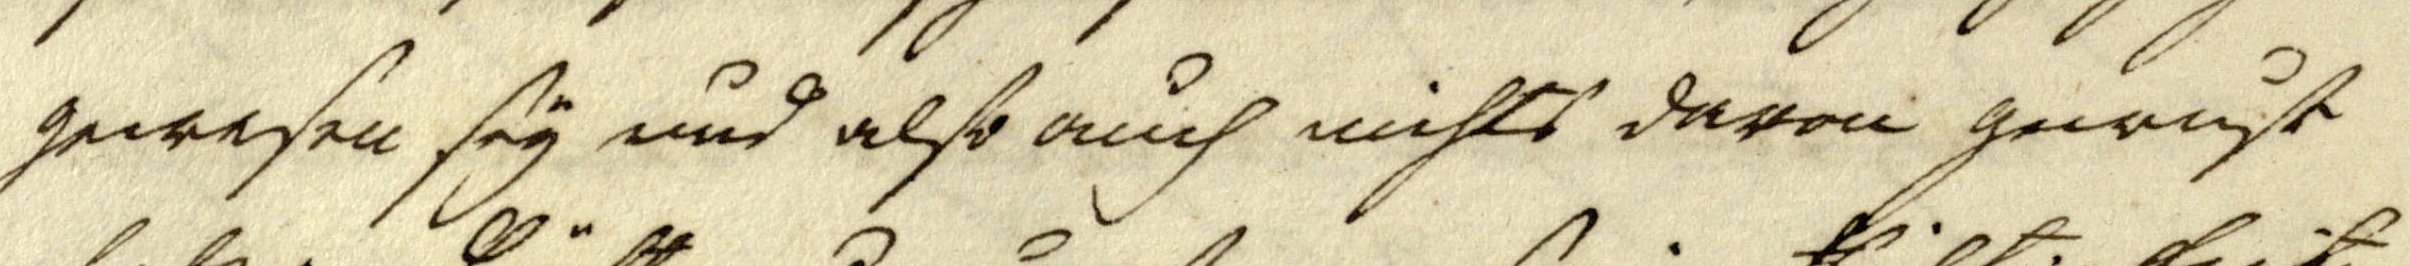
gewesen seÿ und also auch nichts davon gewußt
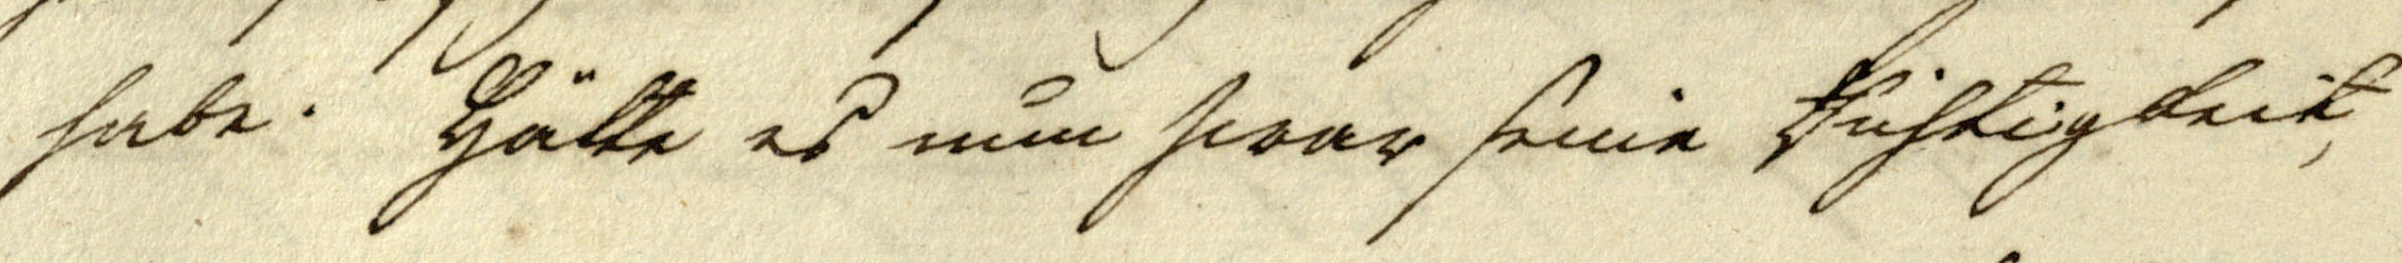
habe. Hätte es nun zwar seine Richtigkeit,
